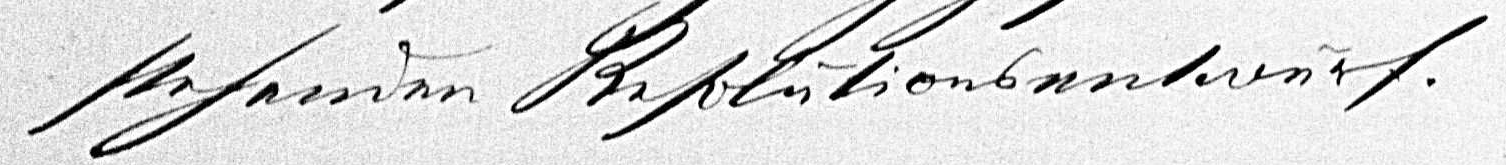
stehenden Resolutionsentwurf.
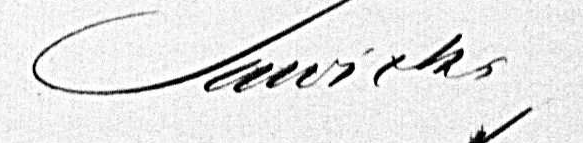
Sawicki
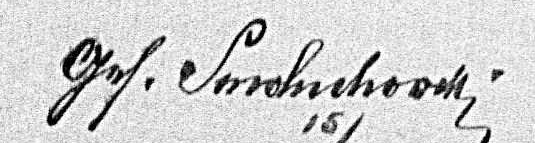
Ges. Smolenchowki
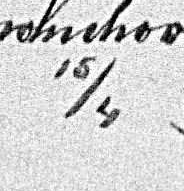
15/4
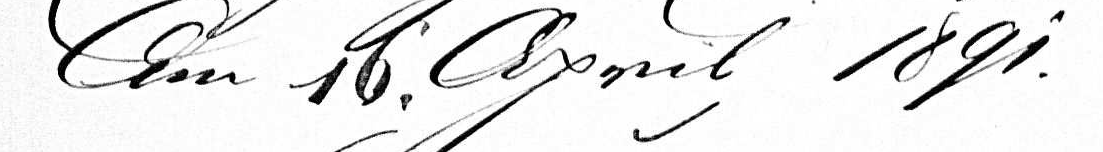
Am. 16 April 1891
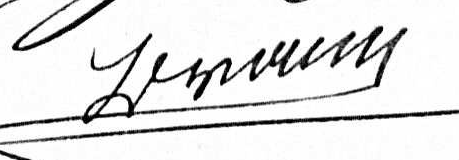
Wraun
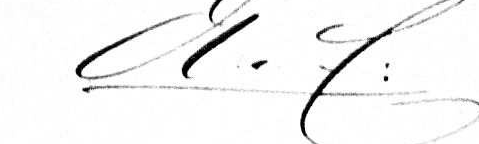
AE
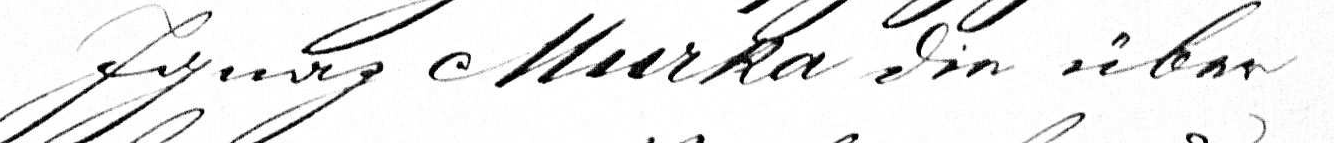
Ignaz Murka die über
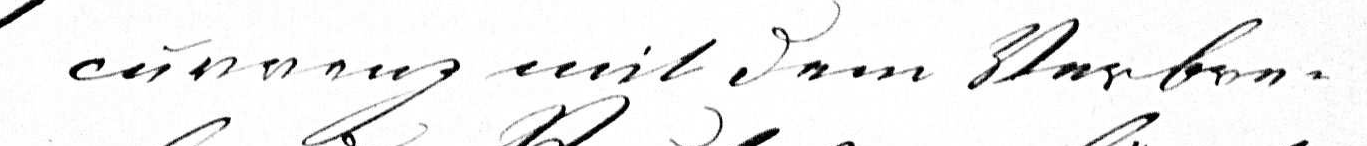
currenz mit dem Verbre¬
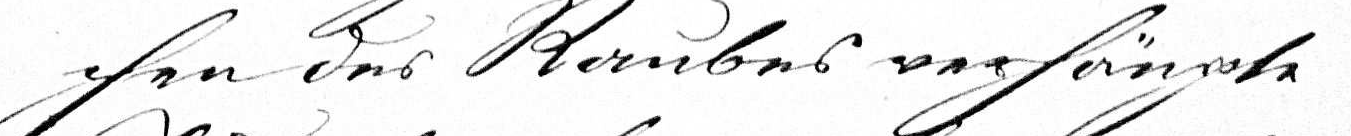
chen des Raubes verhängte
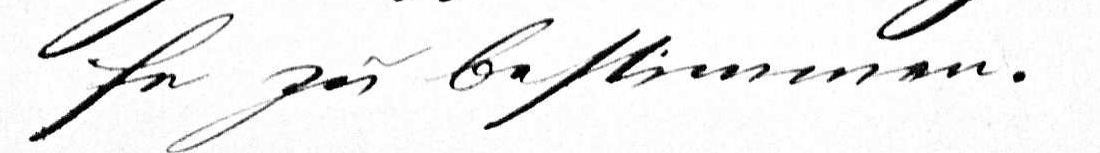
fe zu bestimmen.
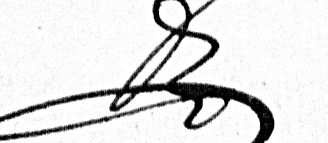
FJ
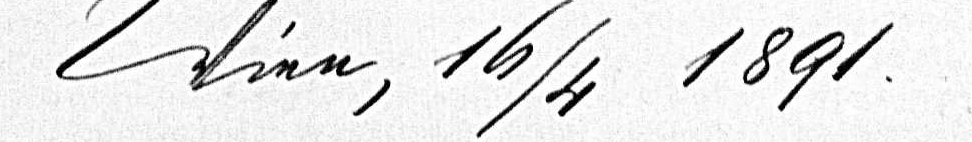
Wien, 16/4 1891
